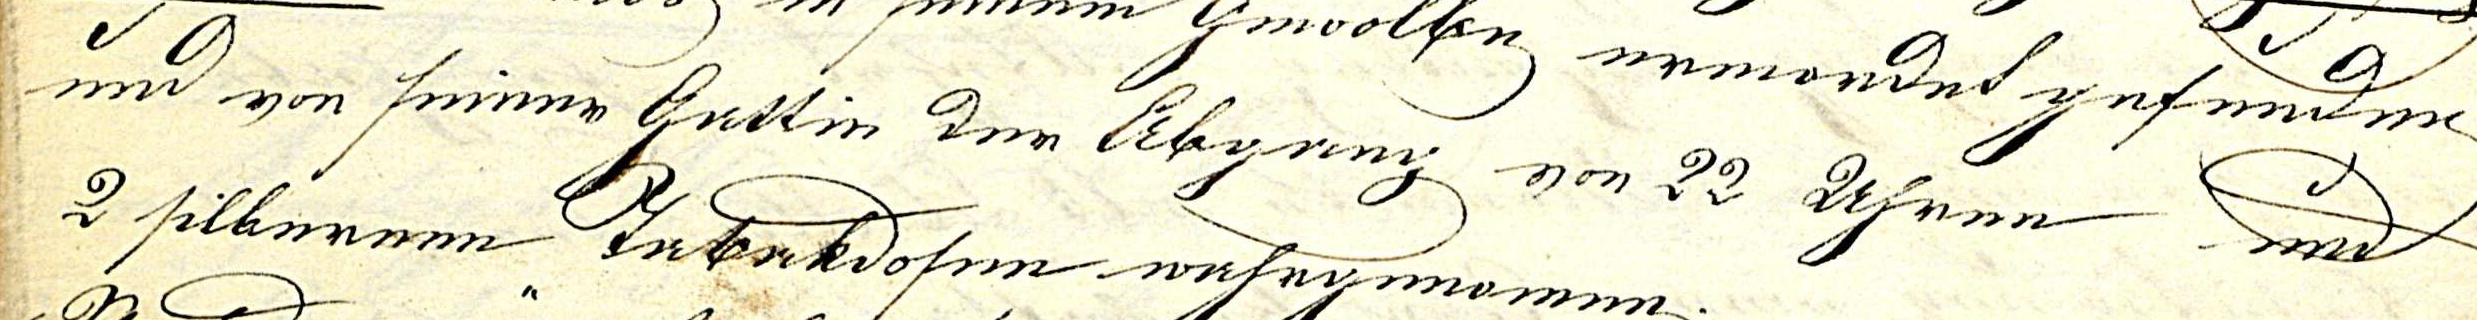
und von seiner Gattin der Abgang von 22 Uhren und
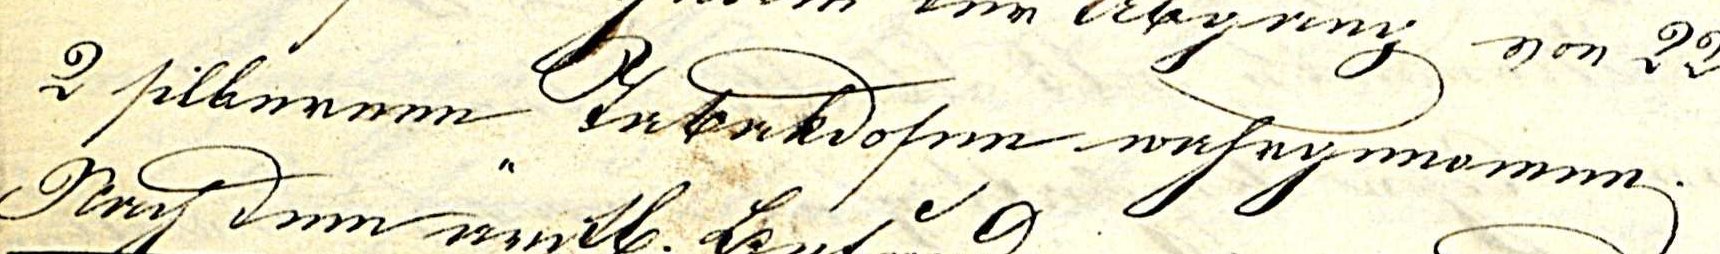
2 silbernen Tabakdosen wahrgenommen.
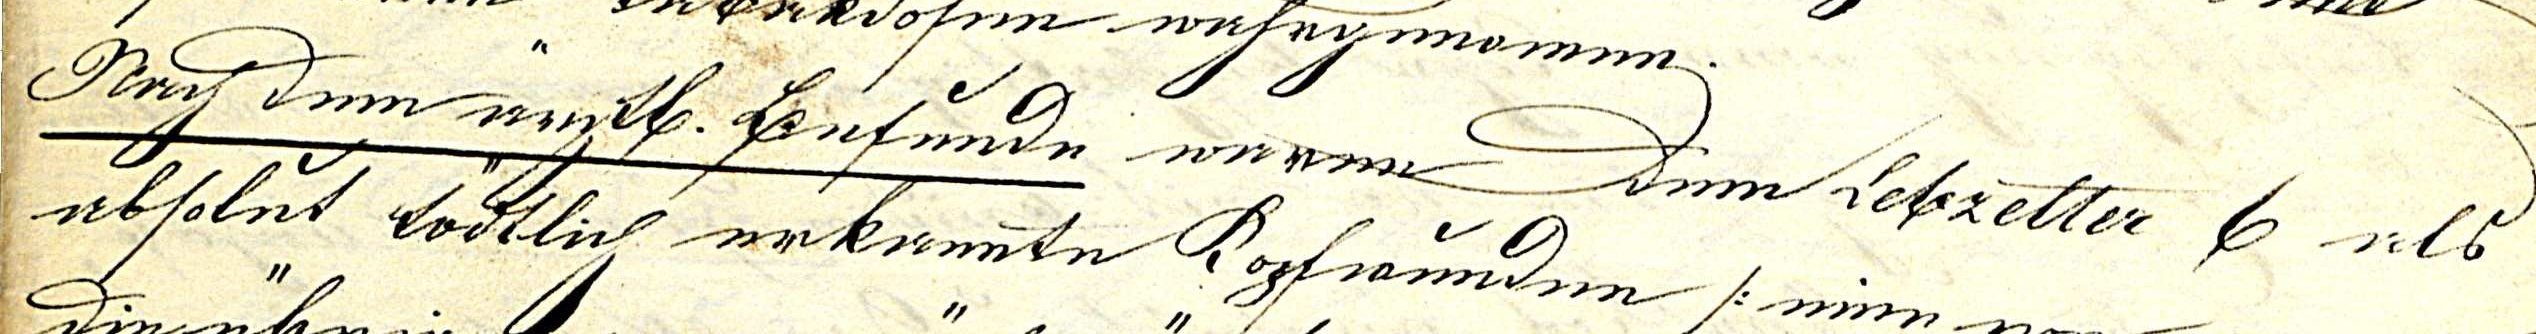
Nach dem ärztl. Befunde waren dem Lebzelter [or Lebzetler?] 6 als
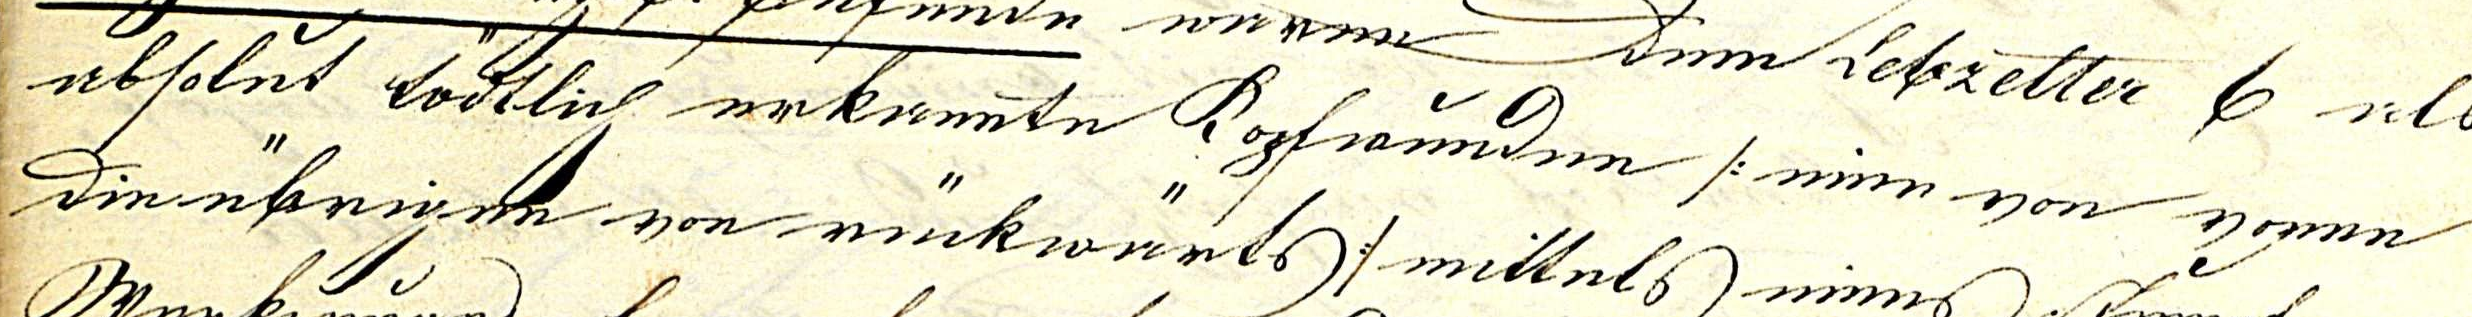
absolut tödtlich erkannte Kopfwunden (eine von vorne
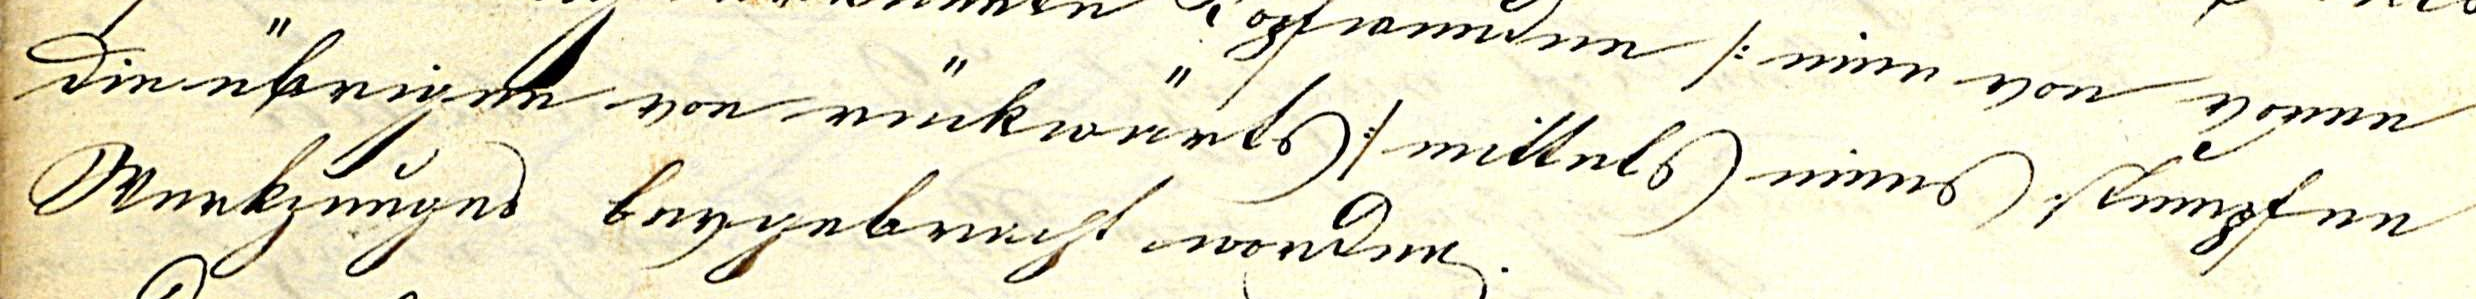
die übrigen von rückwärts) mittels eines stumpfen
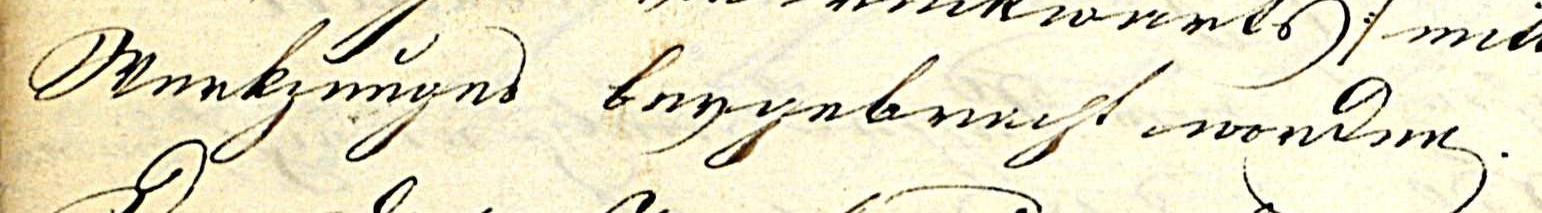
Werkzeuges beygebracht worden.
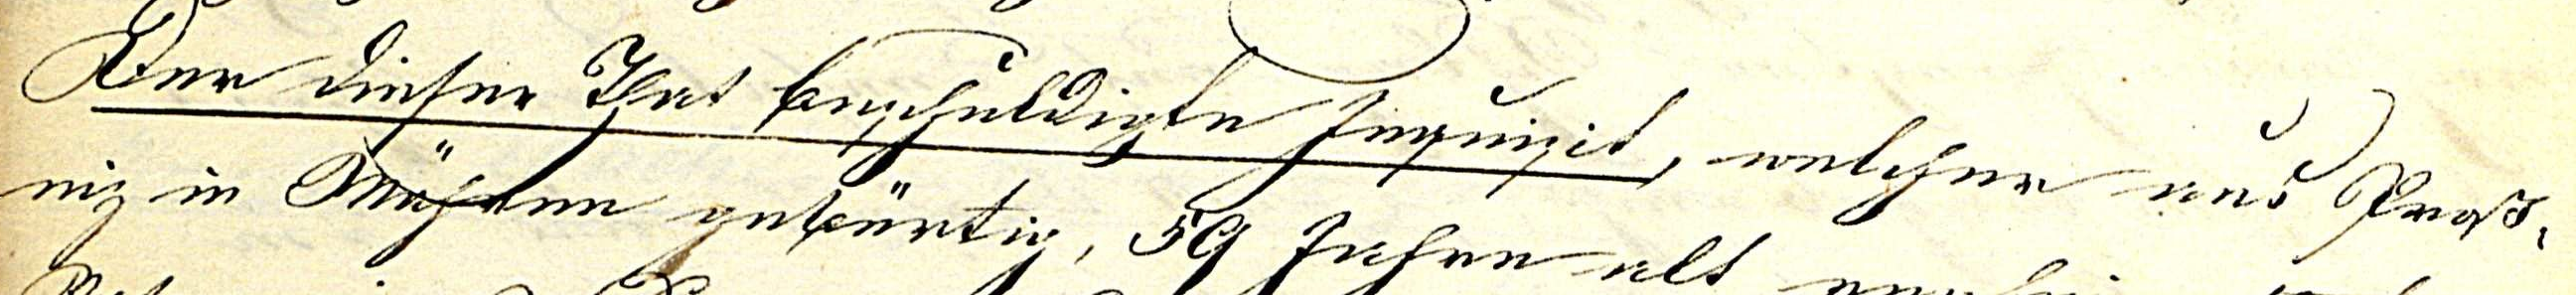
Der dieser That beschuldigte Inquisit, welcher aus Proß¬
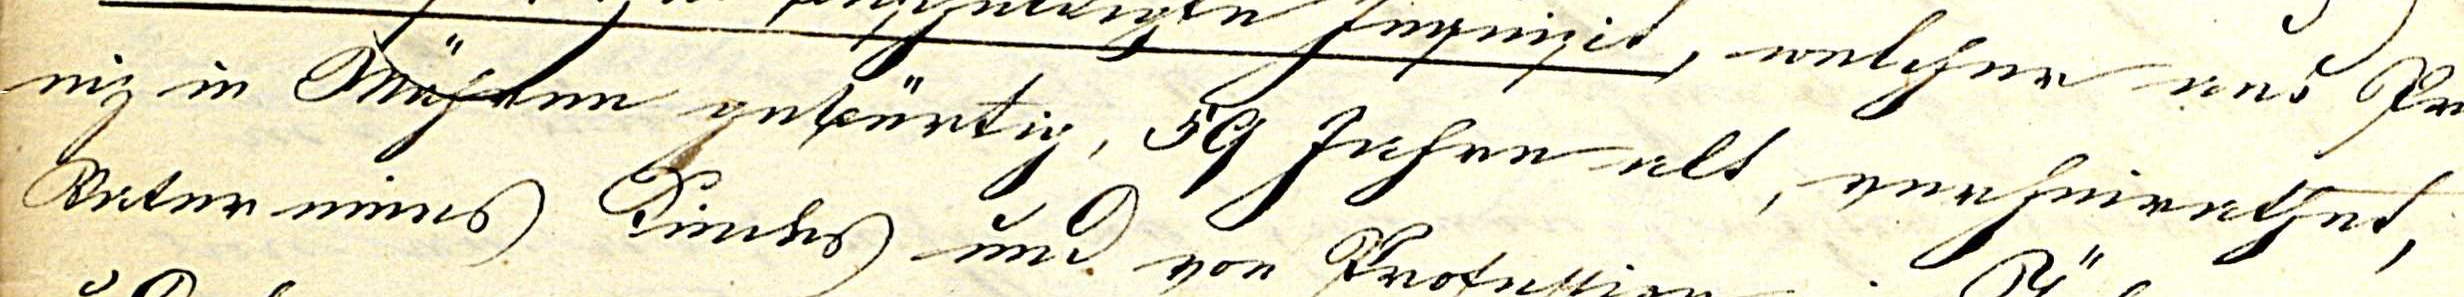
niz [Prostějov] in Mähren gebürtig, 59 Jahre alt, verheirathet,
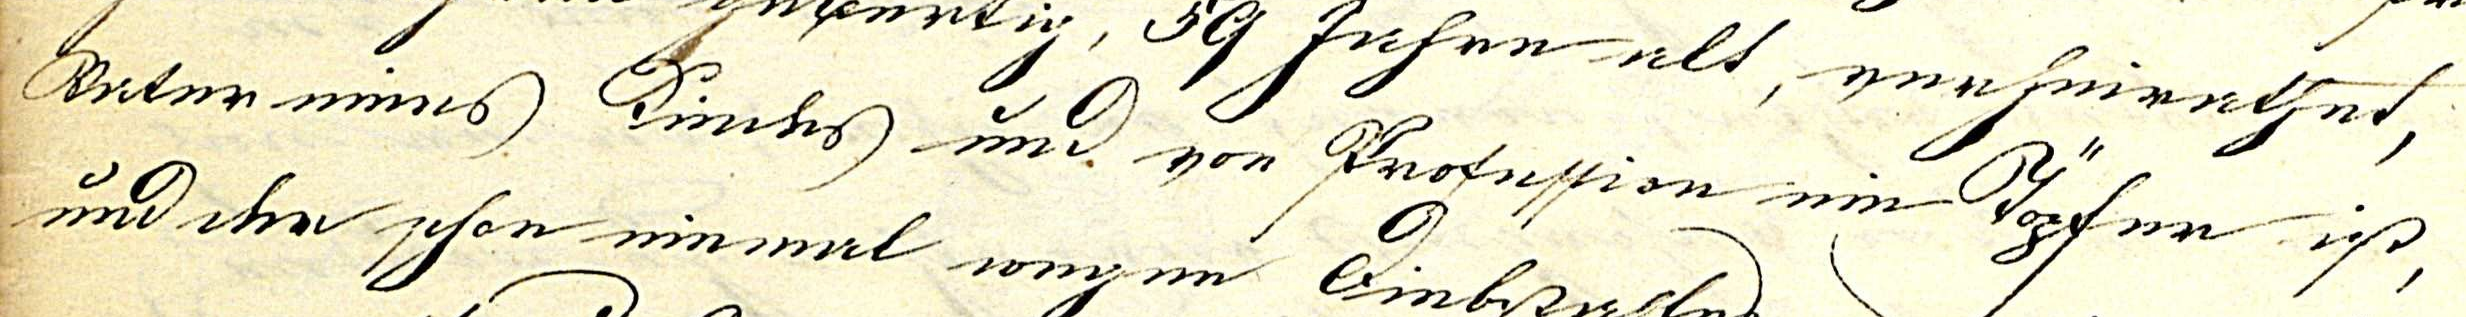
Vater eines Kindes und von Profession ein Töpfer ist,
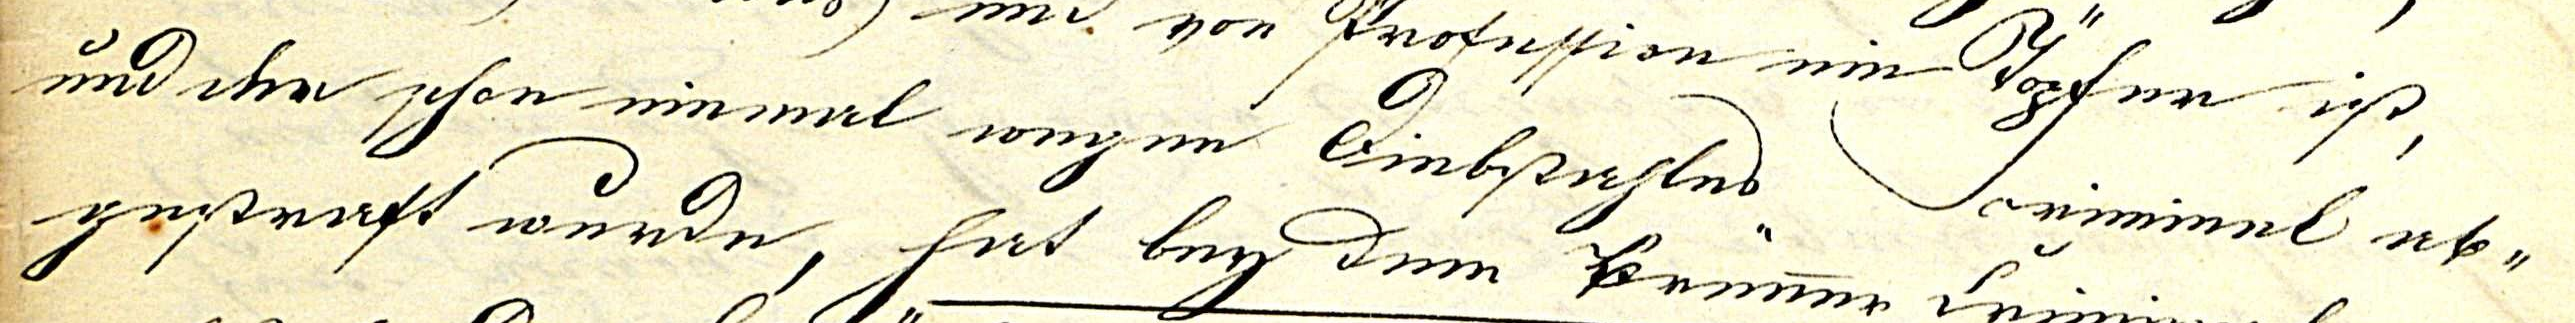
und der schon einmal wegen Diebstahles criminal ab¬
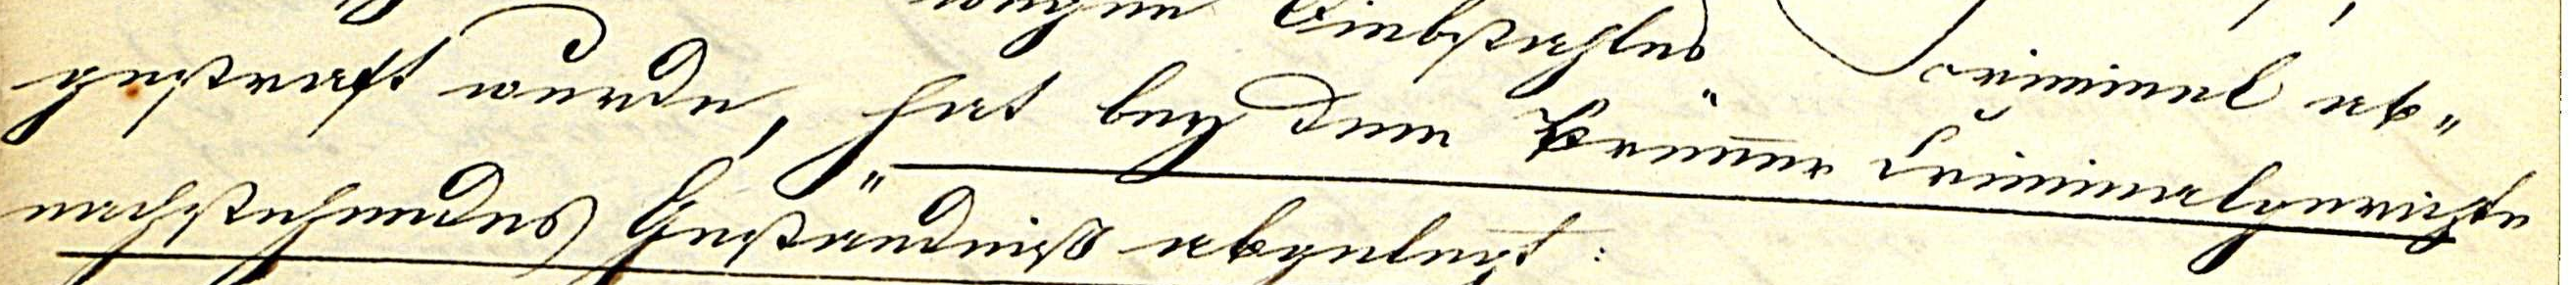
gestraft wurde, hat bey dem Brünner Criminalgerichte
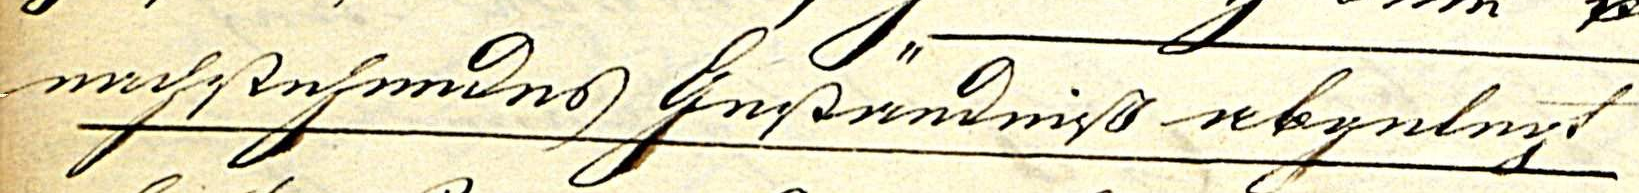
nachstehendes Geständniß abgelegt:
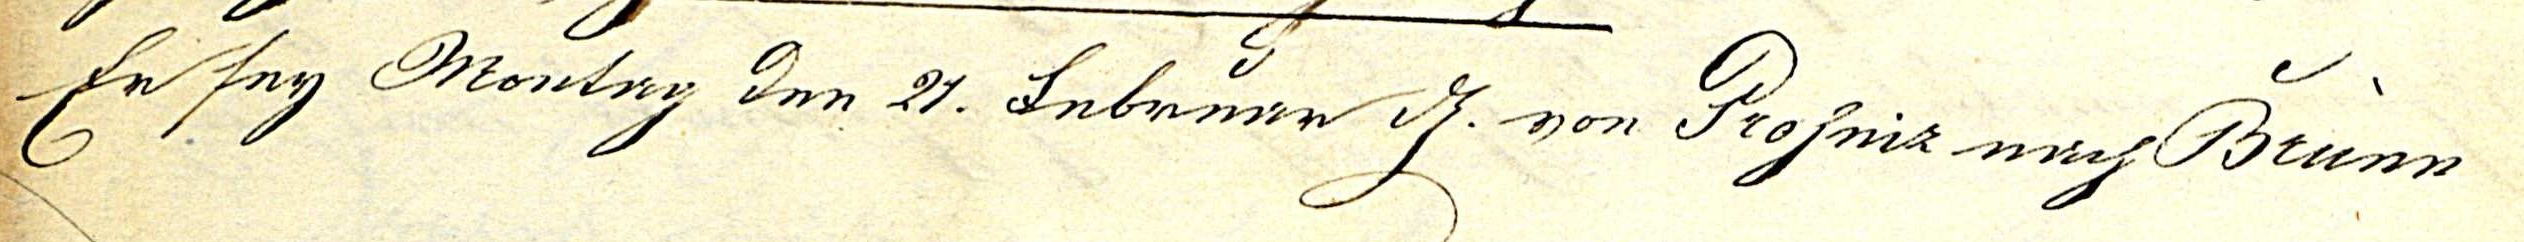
Er sey Montag den 21. Februar d.J. von Proßniz nach Brunn
